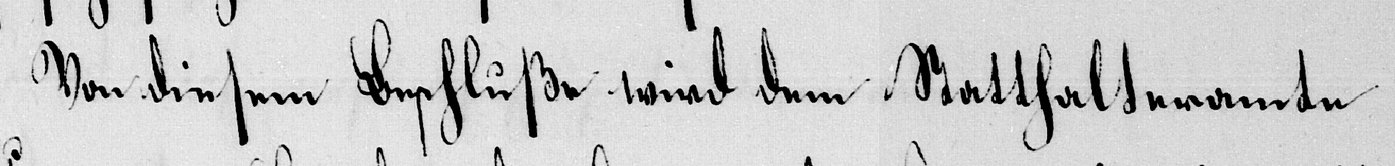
Von diesem Beschluße wird dem Statthalteramte
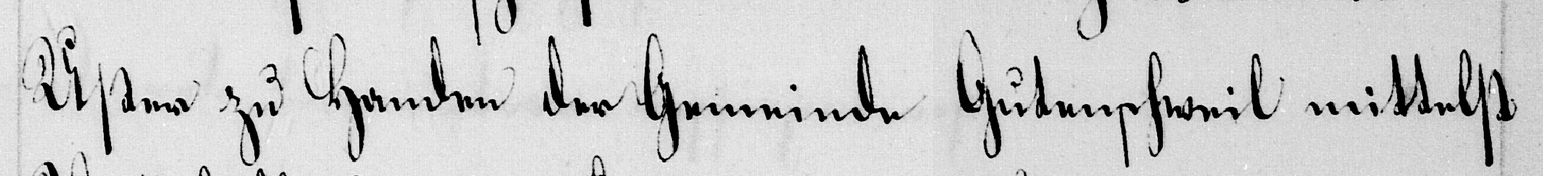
Uster zu Handen der Gemeinde Gutenschweil mittelst
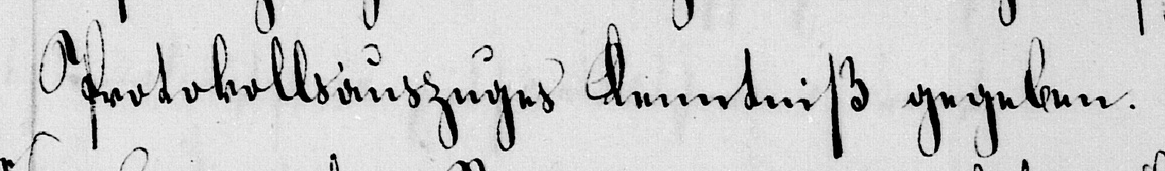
Protokollsauszug Kenntniß gegeben.
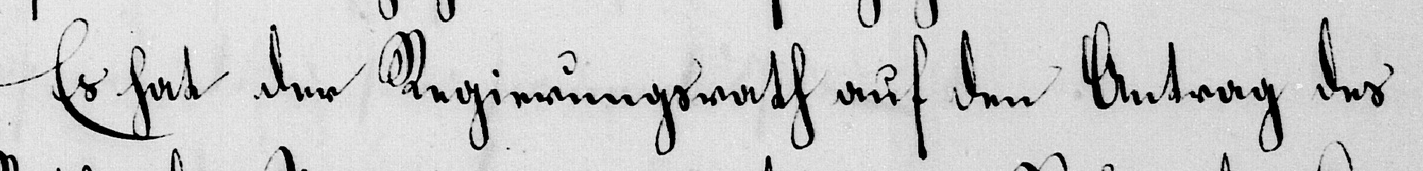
Es hat der Regierungsrath auf den Antrag des
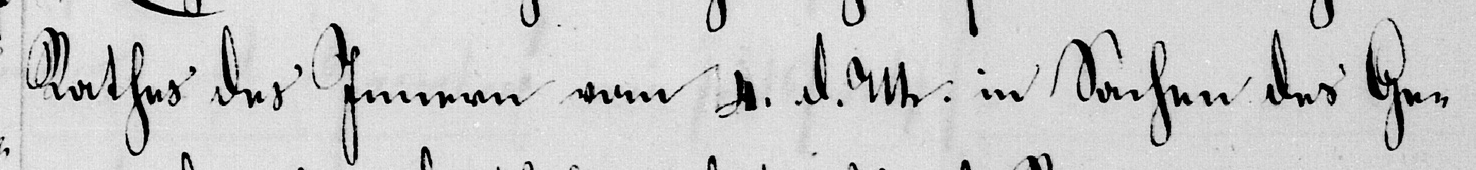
Rathes des Innern vom 4. d. M. in Sachen des Ge¬
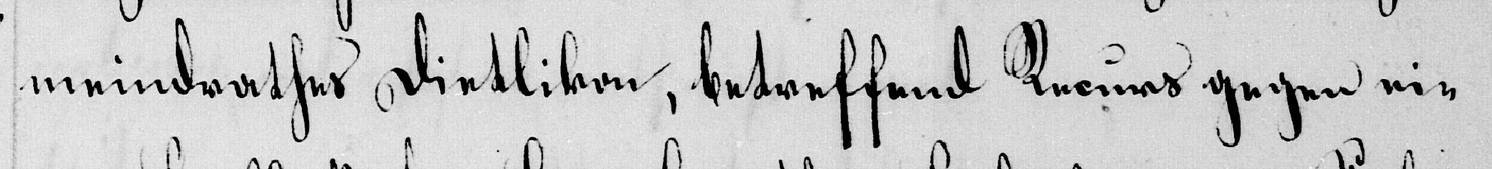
meindrathes Dietlikon, betreffend Recurs gegen ei¬
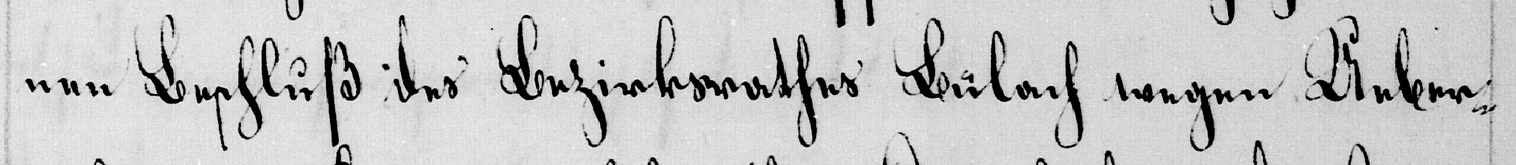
nen Beschluß des Bezirksrathes Bülach wegen Ueber¬
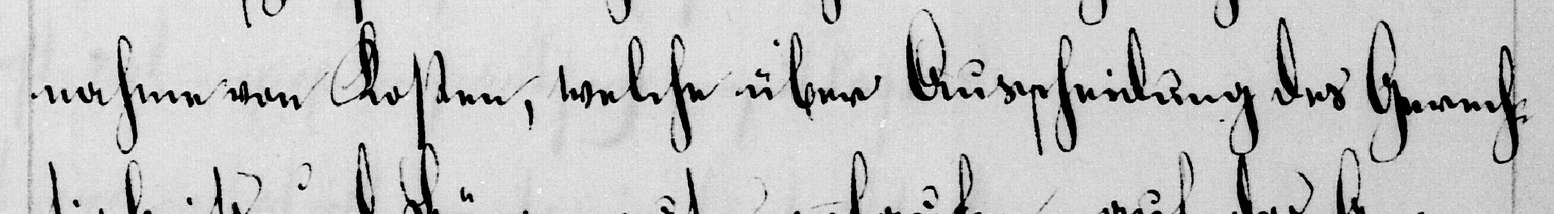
nahme von Kosten, welche über Ausscheidung des Gerech¬
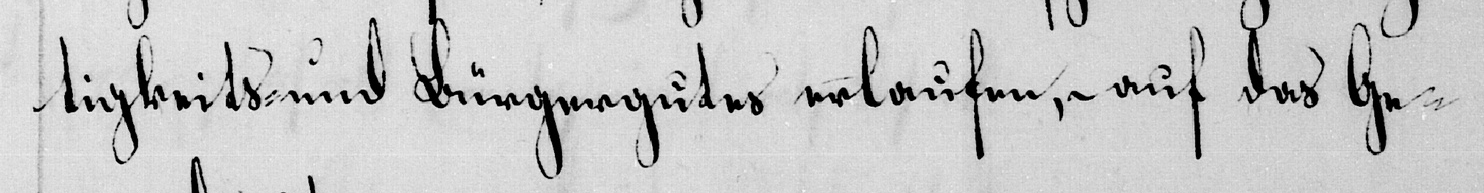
tigkeits- und Bürgergutes erlaufen, – auf das Ge¬
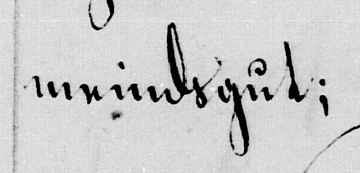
meindsgut;
